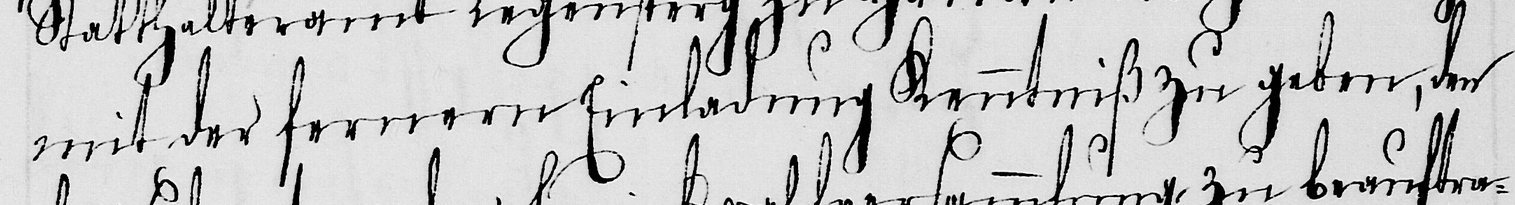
mit der fernern Einladung Kenntniß zu geben, den
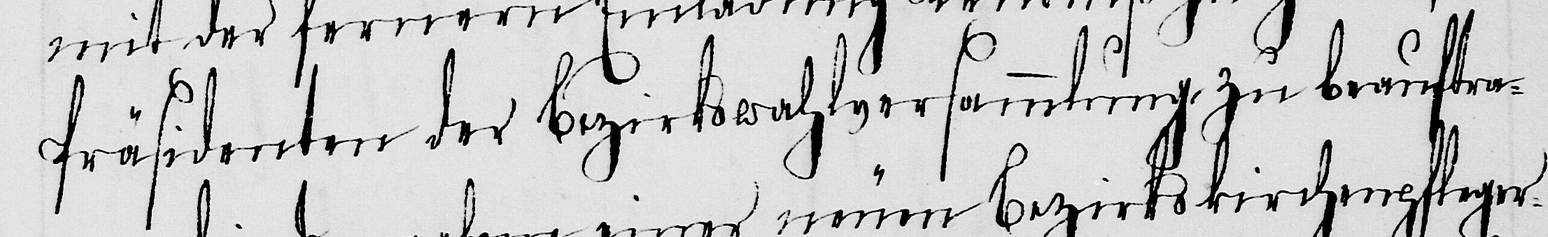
Präsidenten der Bezirkswahlversammlung zu beauftra¬
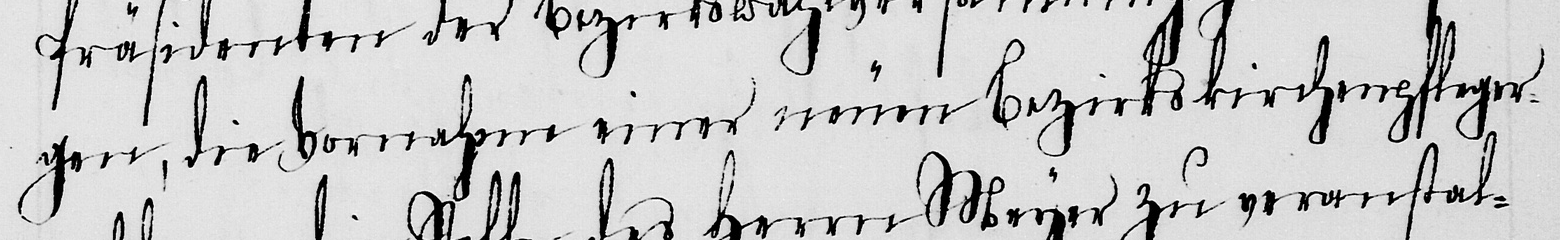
gen, die Vornahme einer neuen Bezirkskirchenpfleger¬
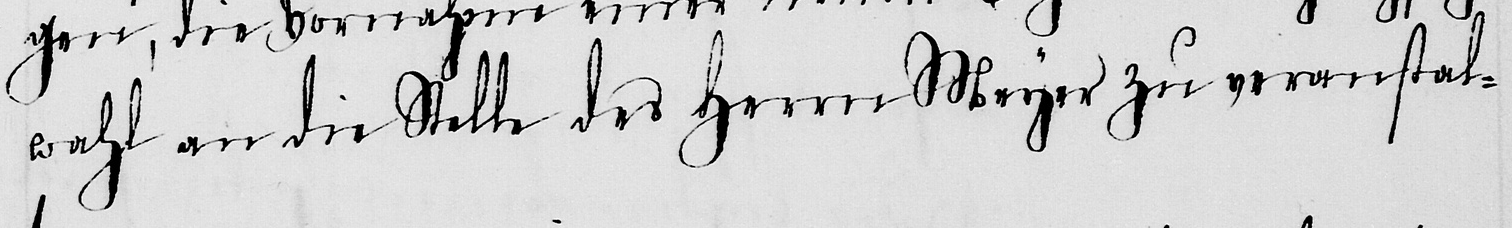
wahl an die Stelle des Herrn Meyer zu veranstal¬
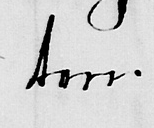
ten.
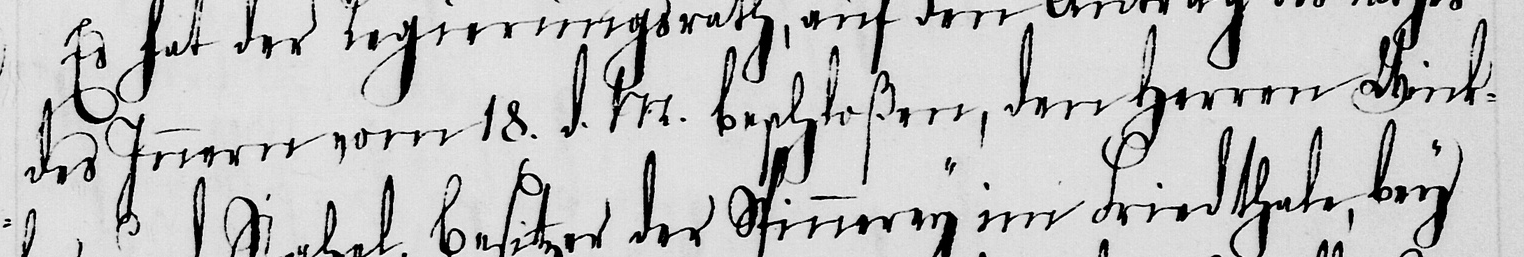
des Innern vom 18. d. M. beschloßen, den Herren Wink¬
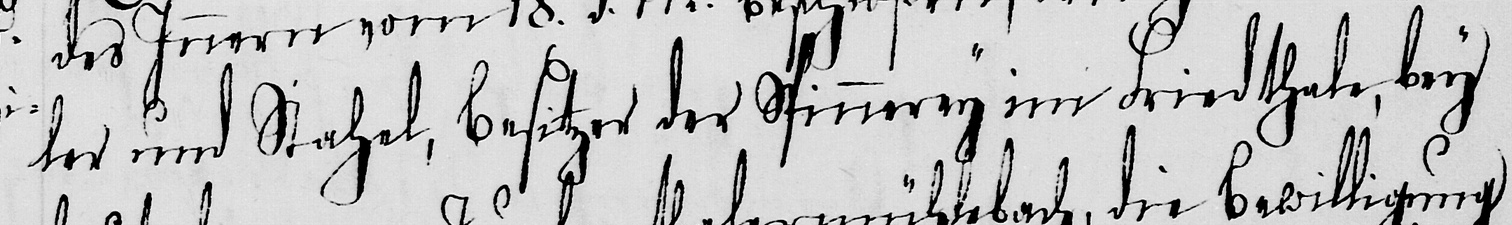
ler und Stahel, Besitzer der Spinnerey im Friedthale, bey
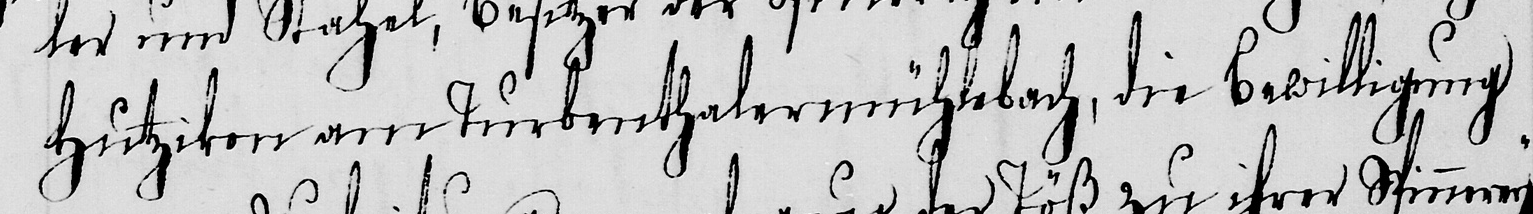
Hutzikon am Turbenthalermühlebach, die Bewilligung
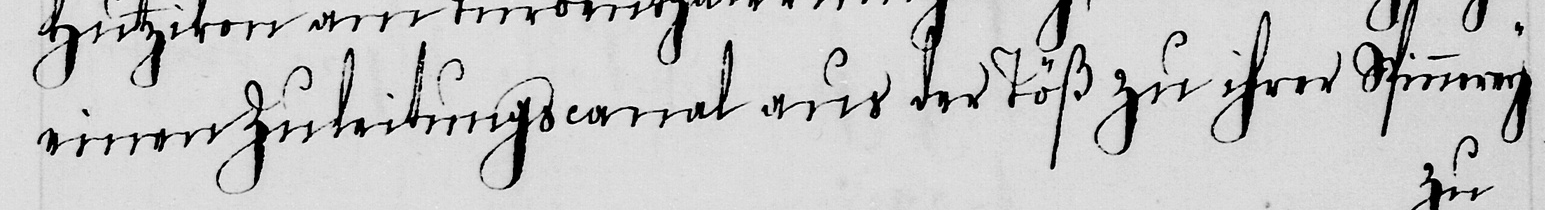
einen Zuleitungscanal aus der Töß zu ihrer Spinnerey
